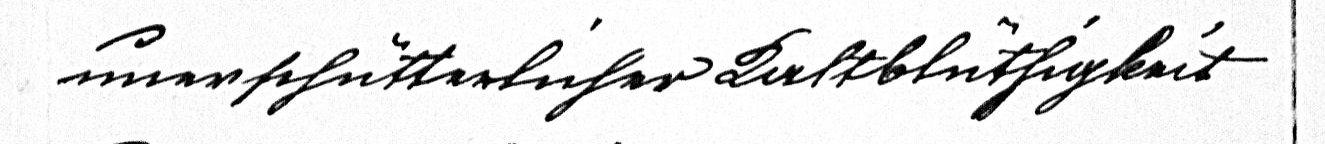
nuerschütterlicher Kaltblüthigkeit
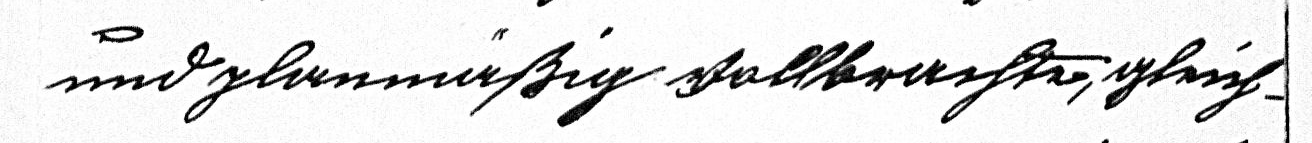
und planmäßig vollbrachte, gleich¬
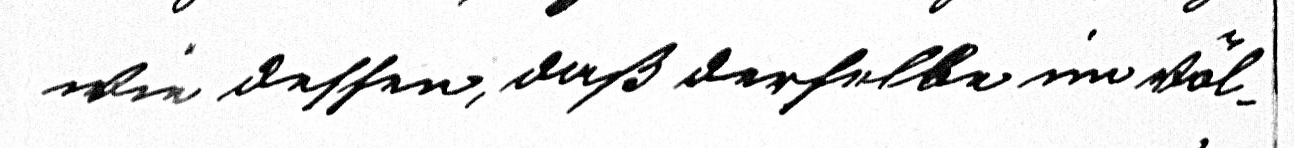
wie dessen, daß derselbe im völ¬
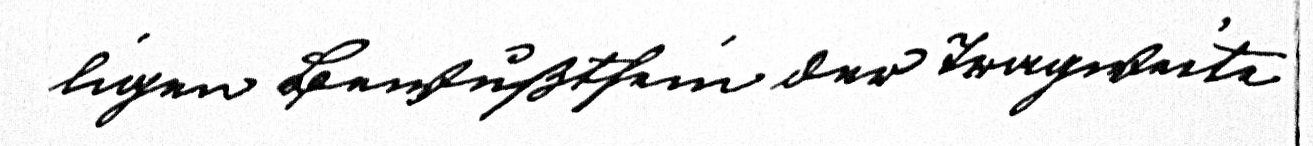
ligen Bewußtsein der Tragweite
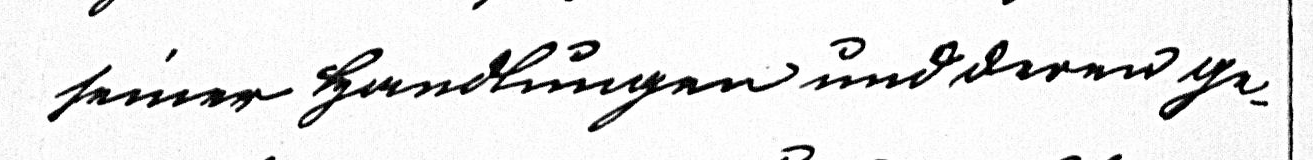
seiner Handlungen und deren ge¬
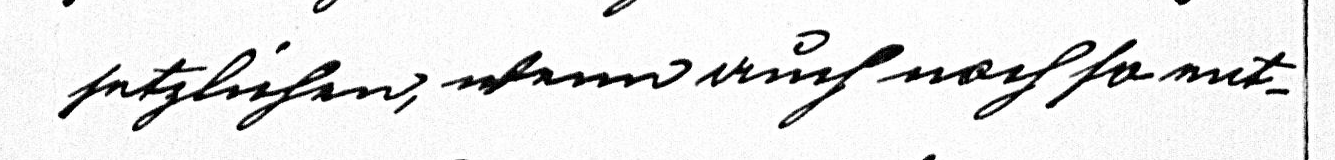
setzlichen, wenn auch noch so mit¬
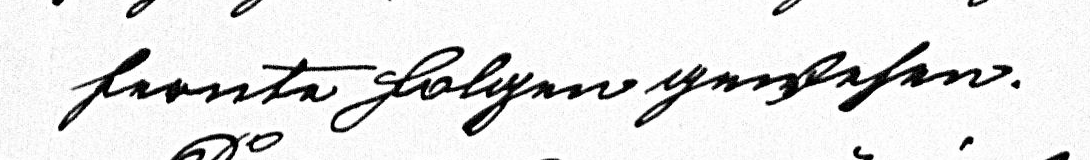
fernte Folgen gewesen.
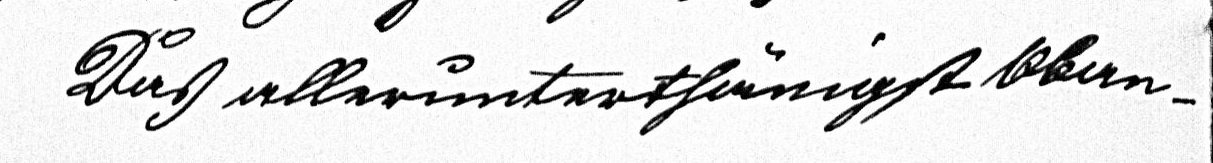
Das allerunterthänigst Oban¬
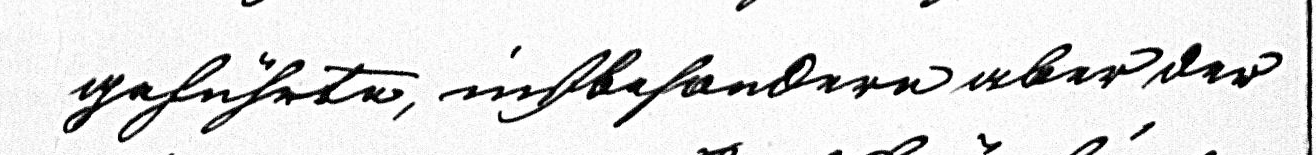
geführte, insbesondere aber der
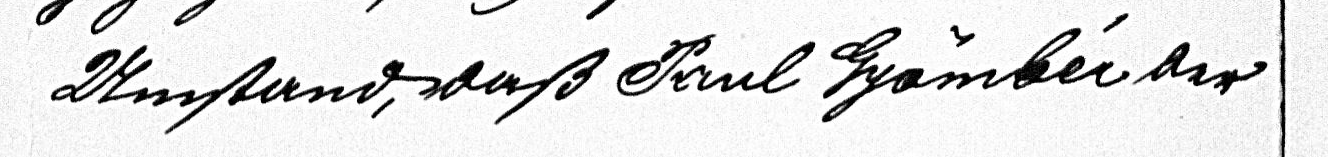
Umstand, daß Paul Gyömbér der
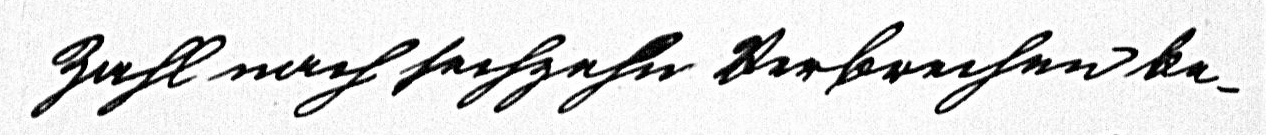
Zahl nach sechzehn Verbrechen be¬
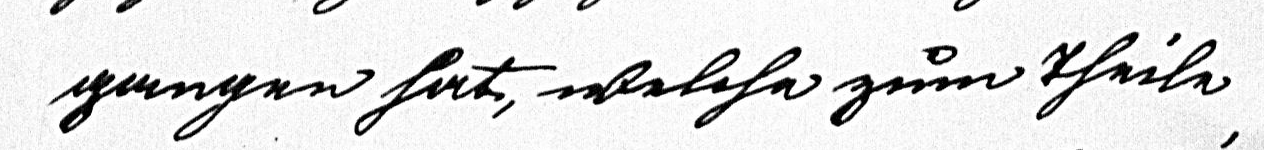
gangen hat, welche zum Theile
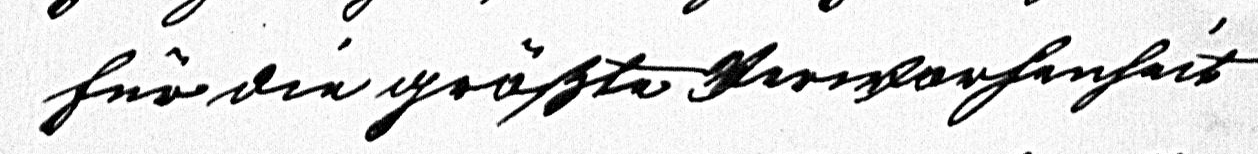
für die größte Verworfenheit
